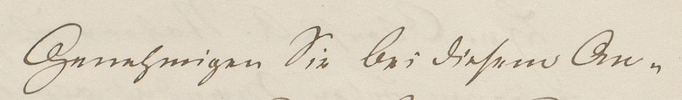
Genehmigen Sie bei diesem An-
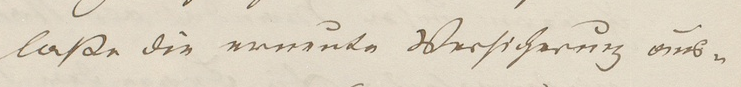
laße die erneute Versicherung aus-
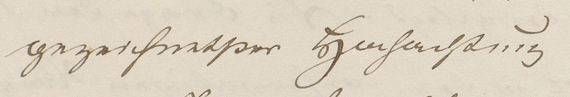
gezeichnetster Hochachtung
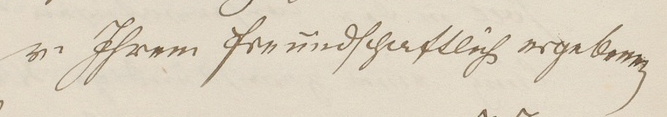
v. Ihrem freundschaftlich ergebenen
